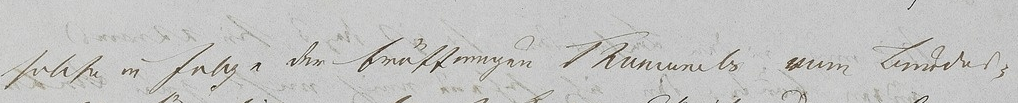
solche in Folge der Eröffnungen Thouvenels vom Bundes-
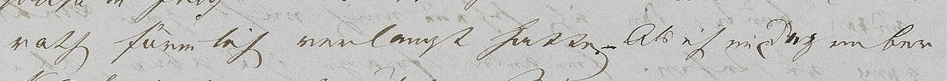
rath förmlich verlangt hatte. – Als ich im Dezember
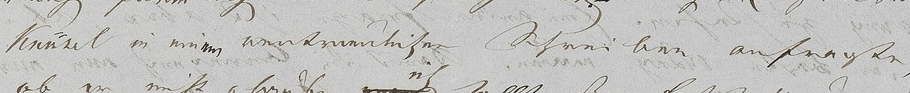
Knüsel in einem vertraulichen Schreiben anfragte,
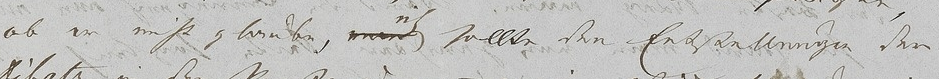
ob er nicht glaube, manich sollte den Entstellungen der
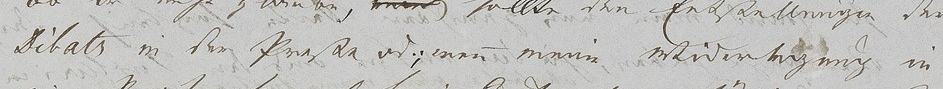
Débats in der Preße od.; wenn meine Widerlegung in
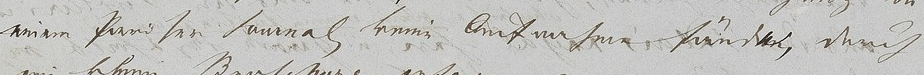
einem Pariser Journal keine Aufnahme fände, durch
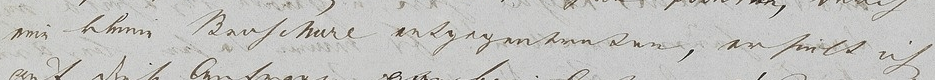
eine kleine Broschure entgegentreten, erhielt ich
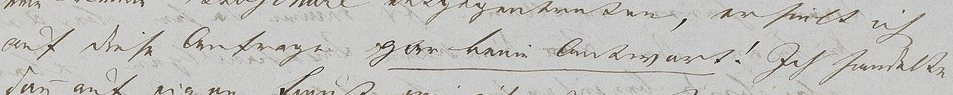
auf diese Anfrage gar keine Antwort! Ich handelte
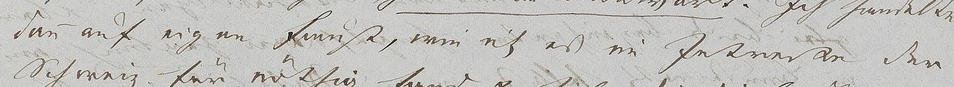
dann auf eigne Faust, wie ich es im Intreße der
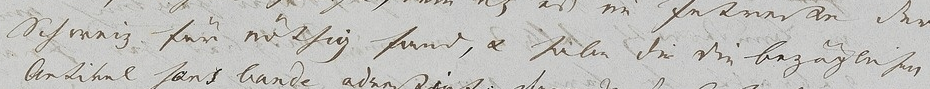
Schweiz für nöthig fand, & habe dir die bezüglichen
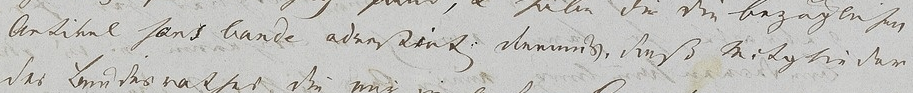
Artikel sans bande adreßirt: daraus, daß Mitglieder
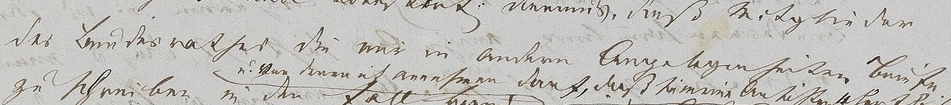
des Bundesrathes die mir in andern Angelegenheiten Briefe
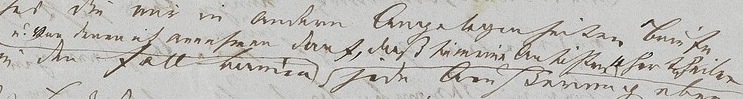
u. von denen ich annehmen darf, daß sie meine Ansichten eher theilen
